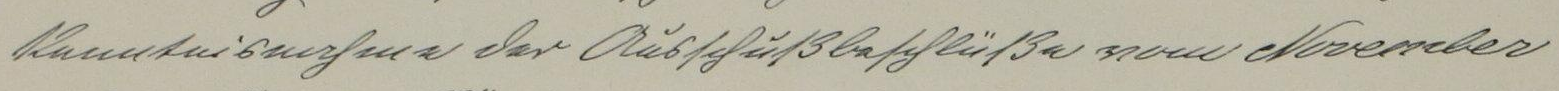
kenntnisnahme der Ausschußbeschlüße vom November
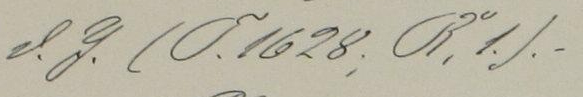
d.J. (T.1628; R.1).
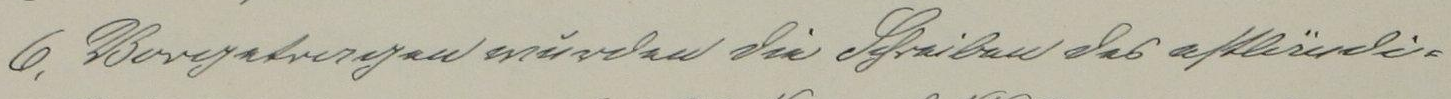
6. Vorgetragen wurden die Schreiben des estländi-
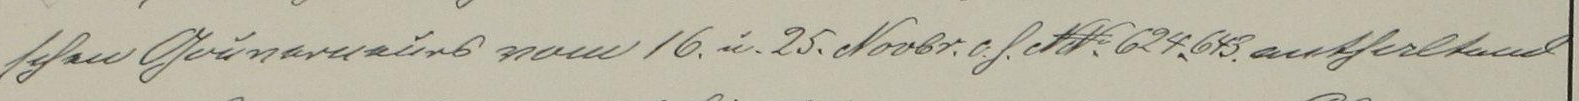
schen Gouverneurs vom 16. u. 25. Novbr. c. s. NNo. 624, 643, enthaltend
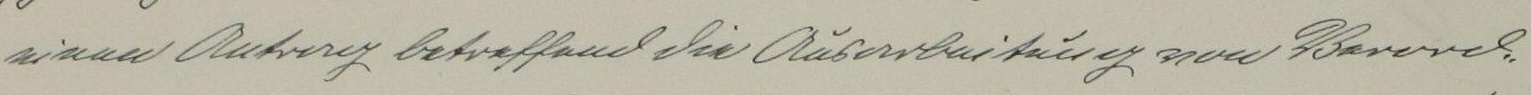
einen Antrag betreffend die Ausarbeitung von Verord-
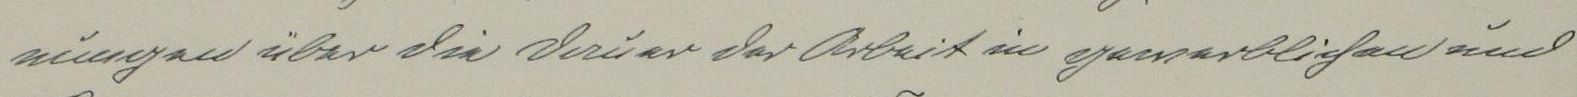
nungen über die Dauer der Arbeit in gewerblichen und
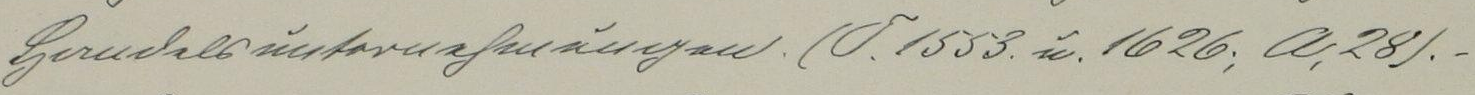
Handelsunternehmungen. (T.1553 u. 1626; A.28).
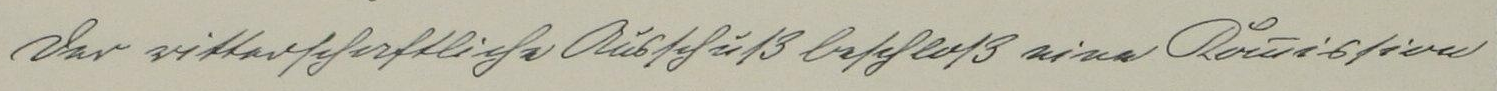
Der ritterschaftliche Ausschuß beschloß eine Kommission
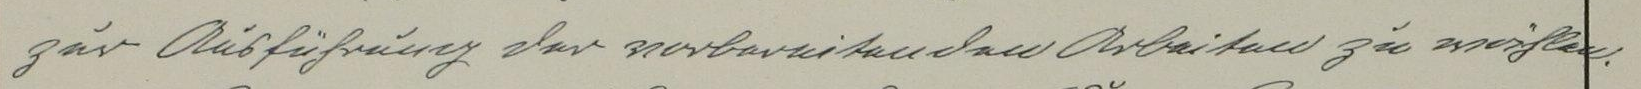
zur Ausführung der vorbereitenden Arbeiten zu wählen.
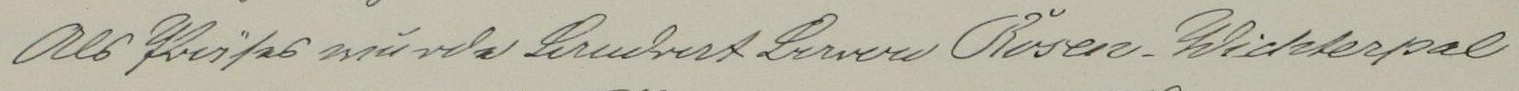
Als Präses wurde Landrat Baron Rosen-Wichterpal
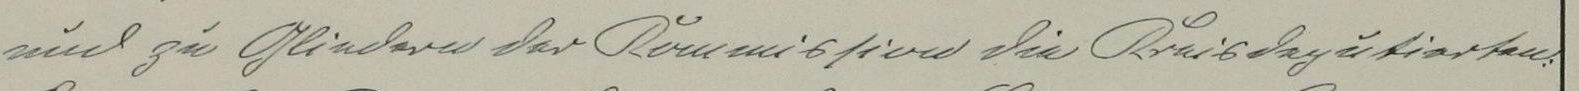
und zu Gliedern der Kommission die Kreisdeputierten:
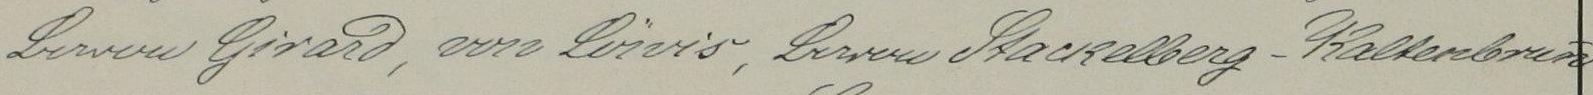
Baron Girard, von Löwis, Baron Stackelberg-Kaltenbrunn
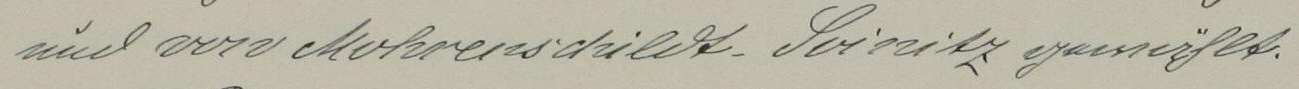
und von Mohrenschildt-Soinitz gewählt.
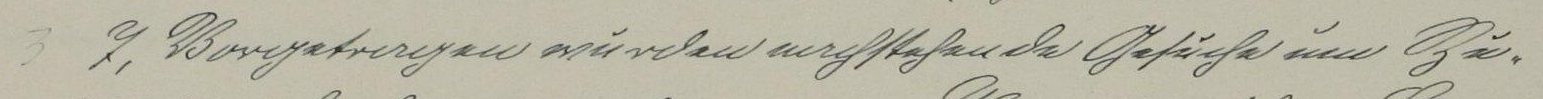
7. Vorgetragen wurden nachstehende Gesuche um Zu-
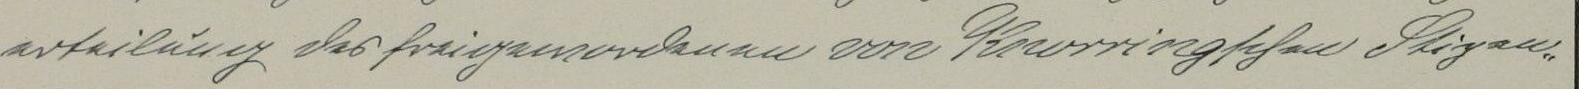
erteilung des freigewordenen von Knorringschen Stipen-
